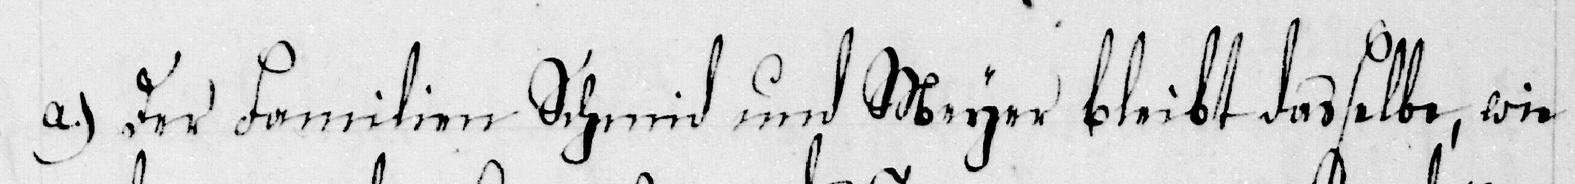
a.) Der Familien Schmid und Meyer bleibt dasselbe, wie
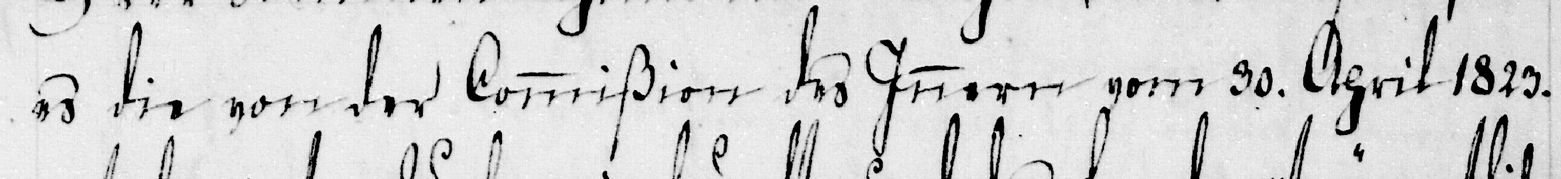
es die von der Commißion des Innern vom 30. April 1823.
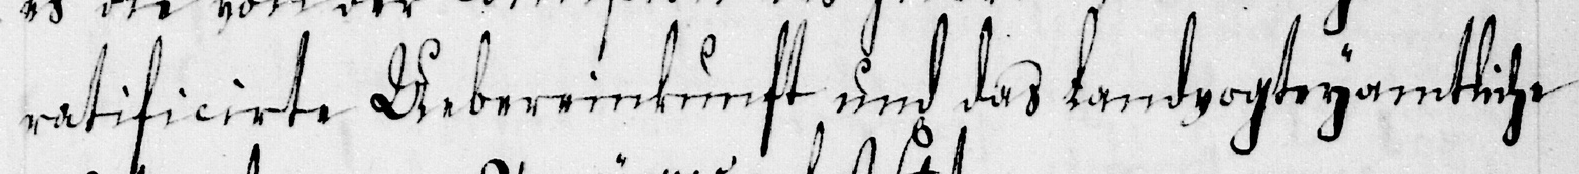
ratificirte Uebereinkunft und das Landvogteyamtliche
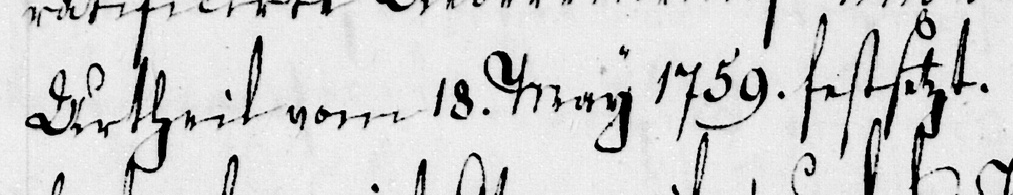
Urtheil vom 18. Mey 1759. festsetzt.
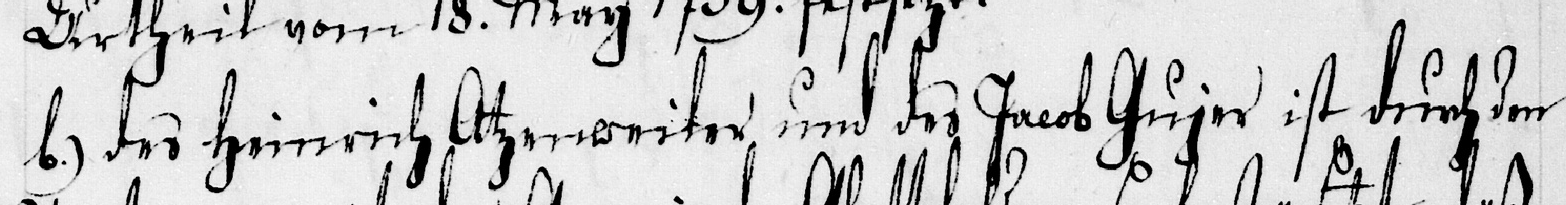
b.) des Heinrich Atzenweiler und des Jacob Gujer ist durch den
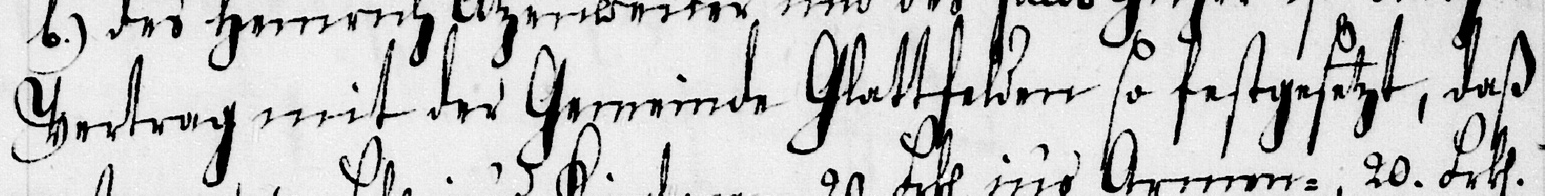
Vertrag mit der Gemeinde Glattfelden so festgesetzt, daß
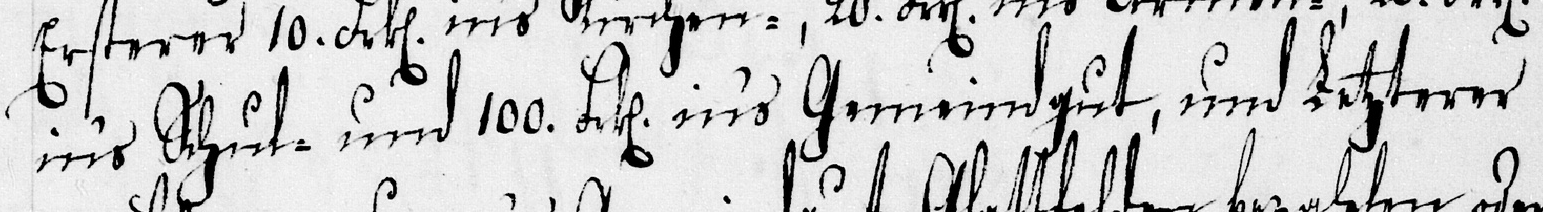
in’s Schul- und 100. Frk[en]. in’s Gemeindegut, und Letzterer
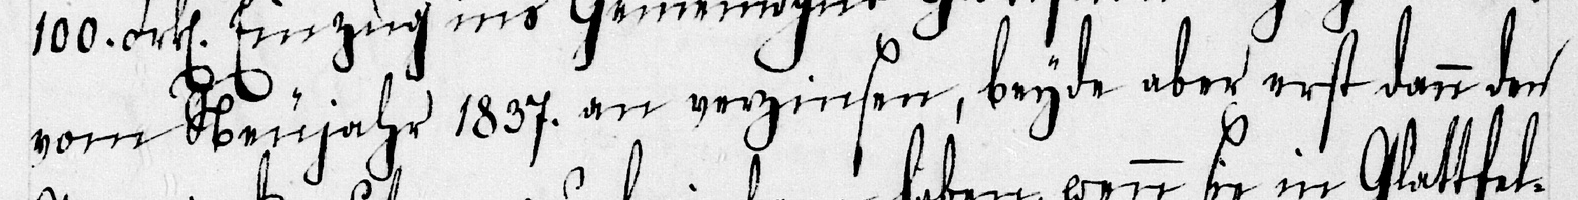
vom Neujahr 1837. an verzinsen, beyde aber erst dann den
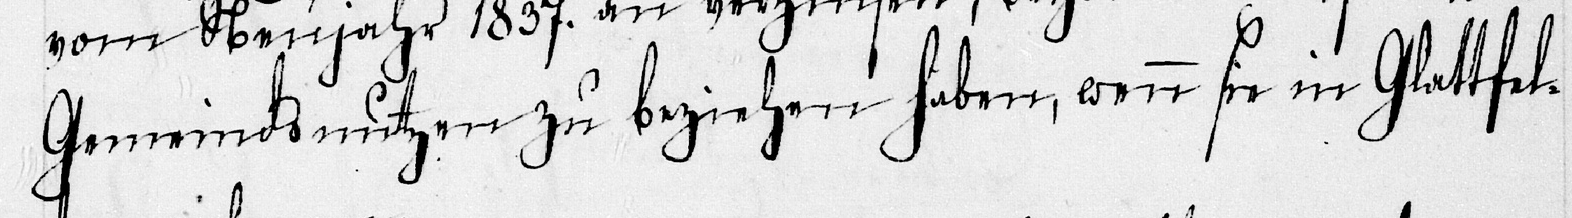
Gemeindsnutzen zu beziehen haben, wenn sie in Glattfel¬
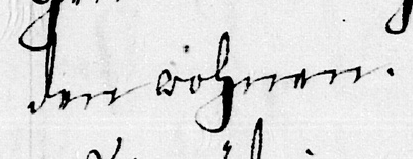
den wohnen.
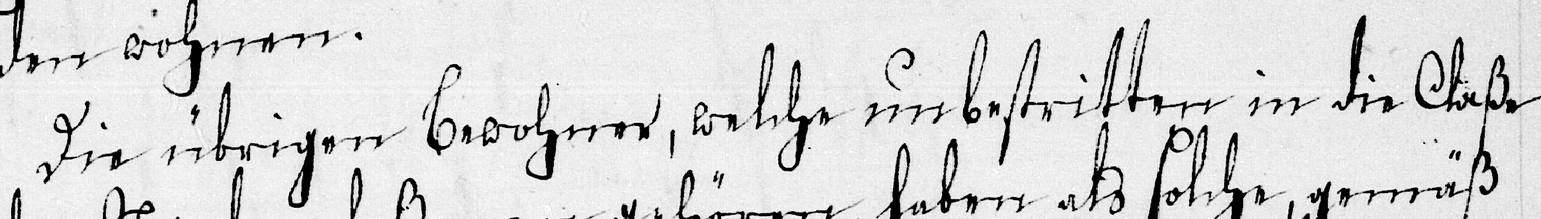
Die übrigen Bewohner, welche unbestritten in die Claße
